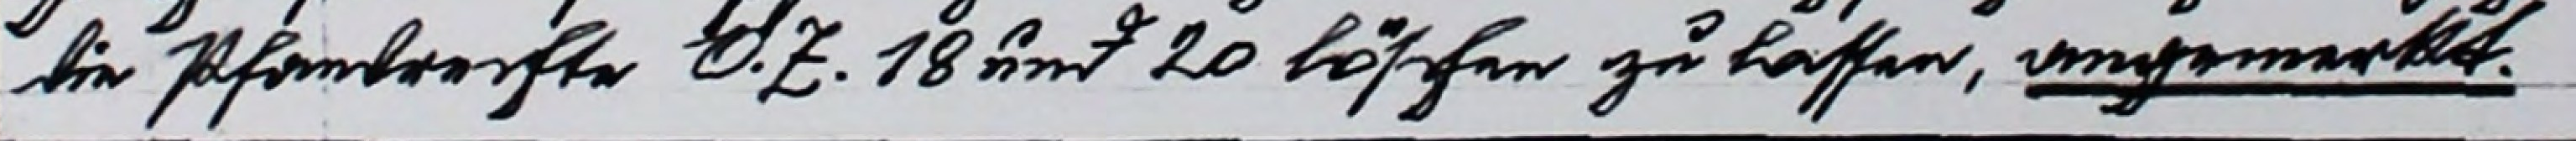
die Pfandrechte O.Z. 18 und 20 löschen zu hassen, angemerkt.
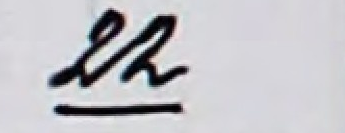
22
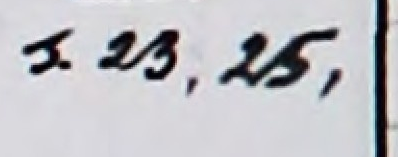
s. 23, 25
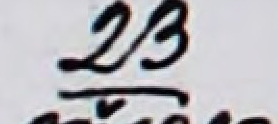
23
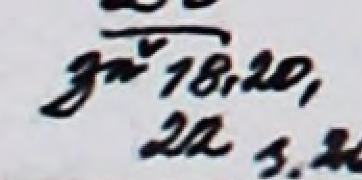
zu 18, 20,
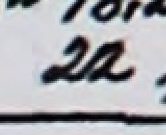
22
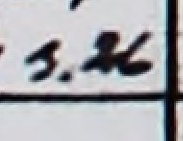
s. 26
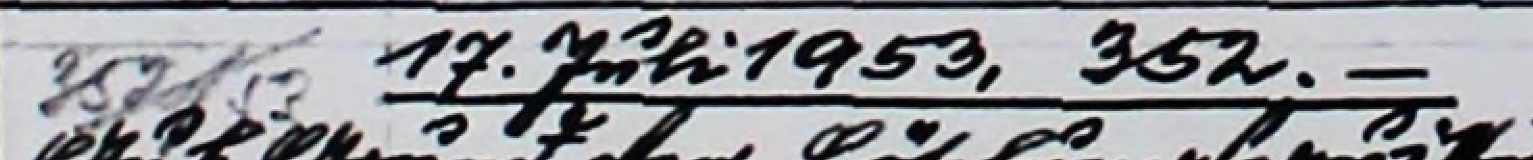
352/53 17. Juli 1953, 352.-
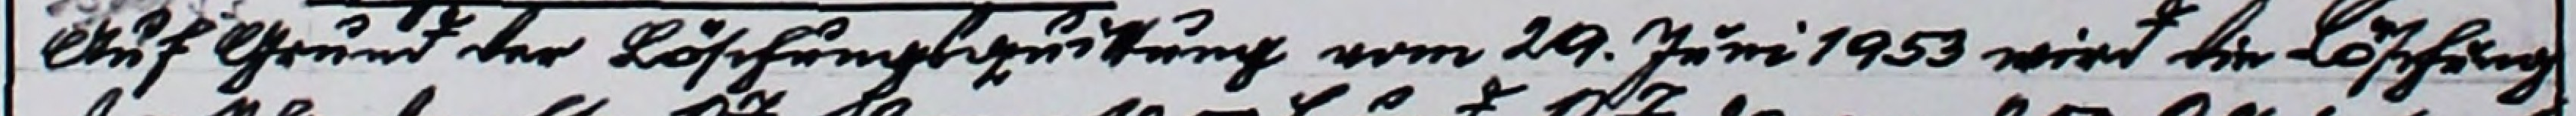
Auf Grund der Löschungsquittung vom 29. Juni 1953 wird die Löschung
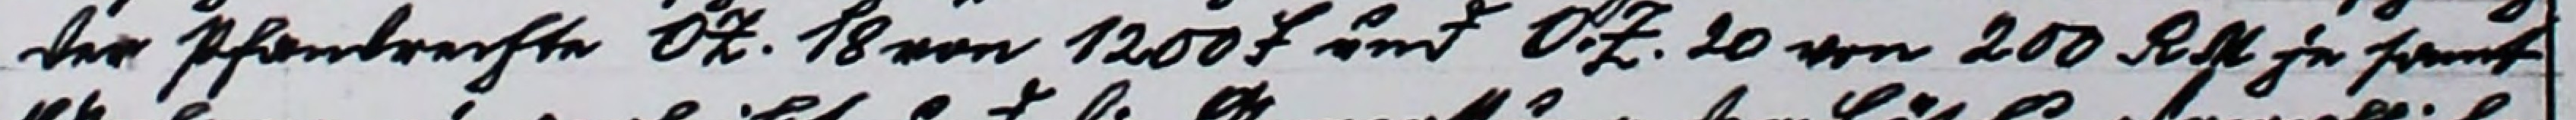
der Pfandrechte OZ. 18 von 1200 F und O.Z. 20 von 200 RM je samt
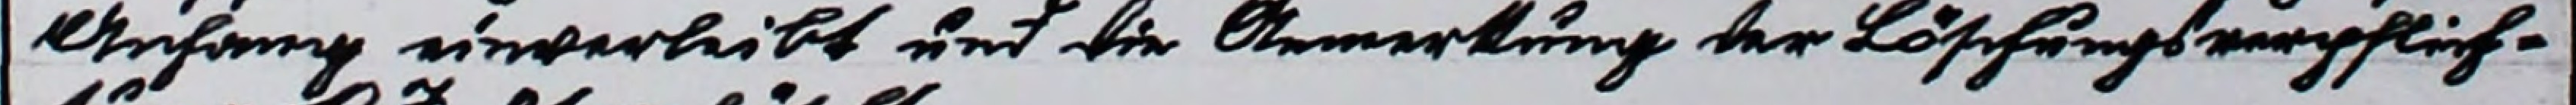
anhang einverleibt und die Anmerkung der Löschungsverpflich=
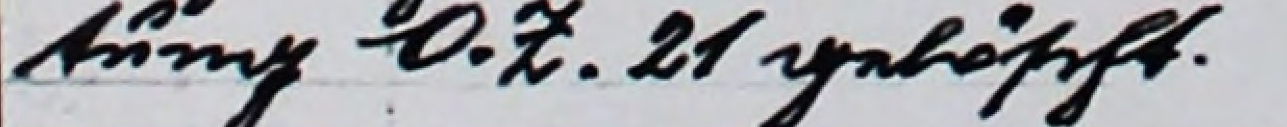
tung O.Z. 21 gelöscht.
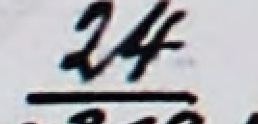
24
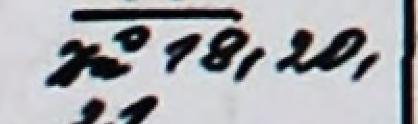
zu 18, 20,
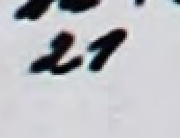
21
